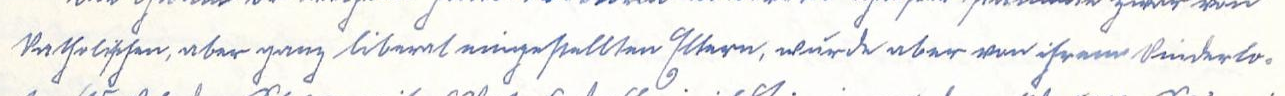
katholischen, aber ganz liberal eingestellten Eltern, wurde aber von ihrem kinderlo-
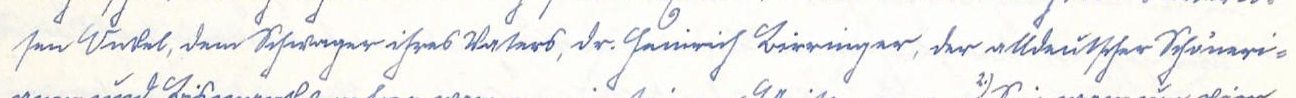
sen Onkel, dem Schwager ihres Vaters, Dr. Heinrich Birringer, der alldeutscher Schöneri-
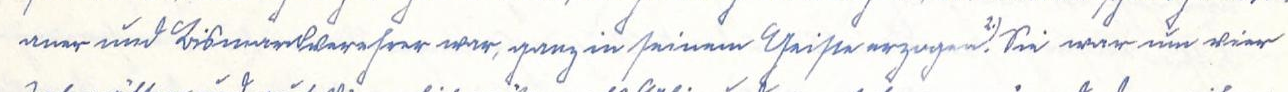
aner und Bismarckverehrer war, ganz in seinem Geiste erzogen. 2.) Sie war um vier
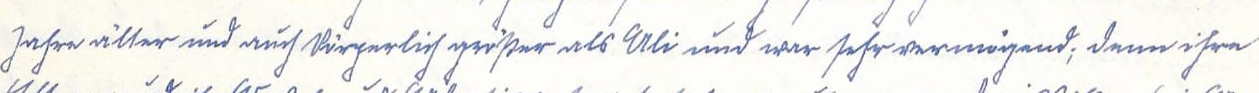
Jahre älter und auch körperlich größer als Ali und war sehr vermögend, denn ihre
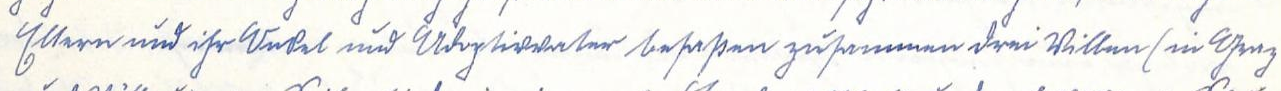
Eltern und ihr Onkel und Adoptivvater besaßen zusammen drei Villen (in Grar-
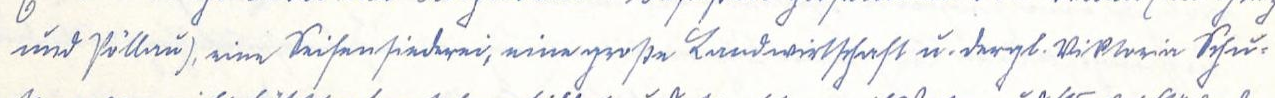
und Pöllau), eine Seifensiederei, eine große Landwittschaft u. dergl. Viktoria Schus-
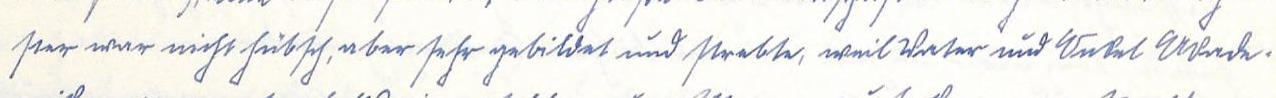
ster war nicht hübsch, aber sehr gebildet und strebte, weil Vater und Onkel Akade-
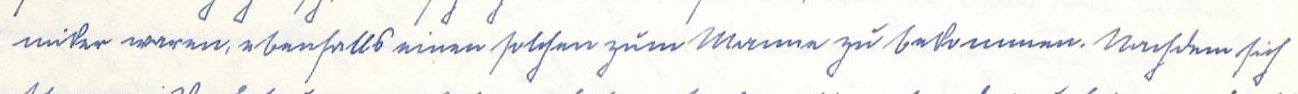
miker waren, ebenfalls einen solchen zum Manne zu bekommen. Nachdem sich
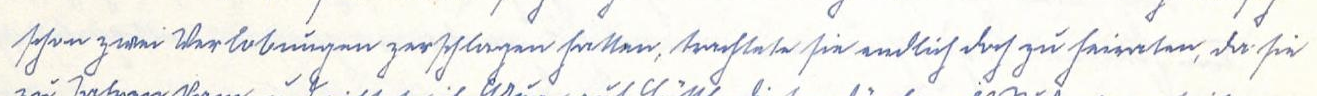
schon zwei Verlobungen zerschlagen hatten, trachtete sie endlich doch zu heiraten, da sie
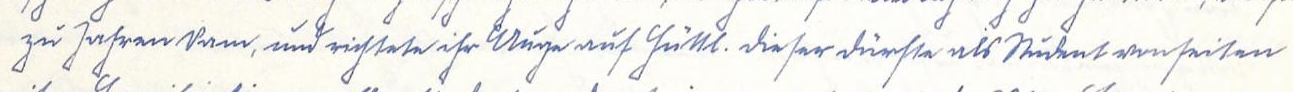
zu Jahren kam, und richtete ihr Auge auf Hüttl. Dieser derfte als Student von seiten
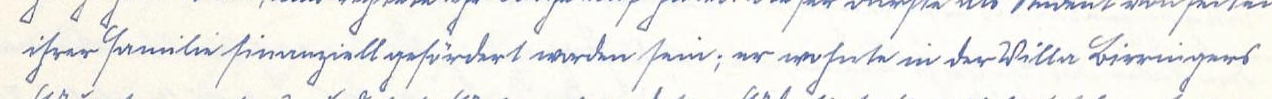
ihrer Familie finanziell gefördert worden sein; er wohnte in der Villa Birringers
